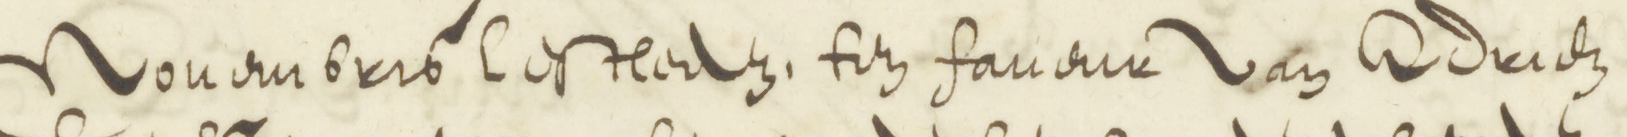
Nouembris lestleden, ten faueur van Adrien
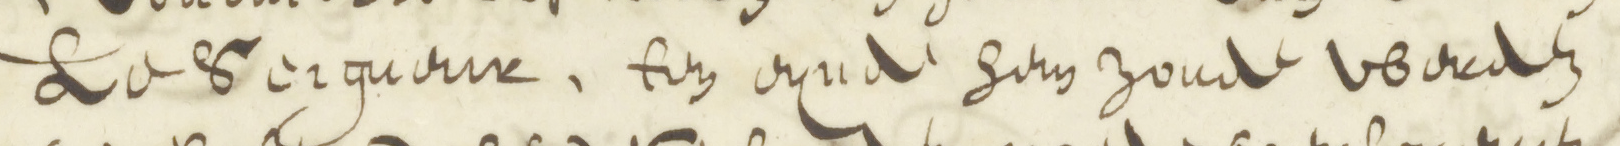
Le Seigneur, ten eynde hem zoude werden
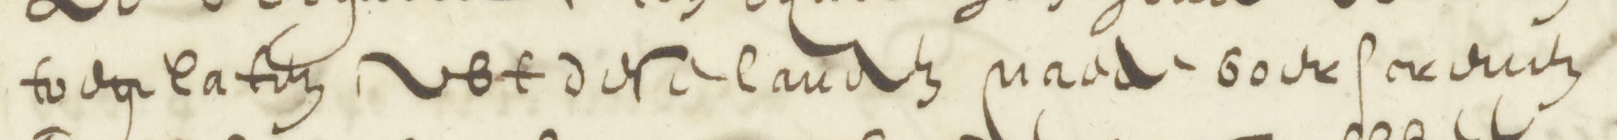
toegelaten Wt dese landen naede voerscreuen
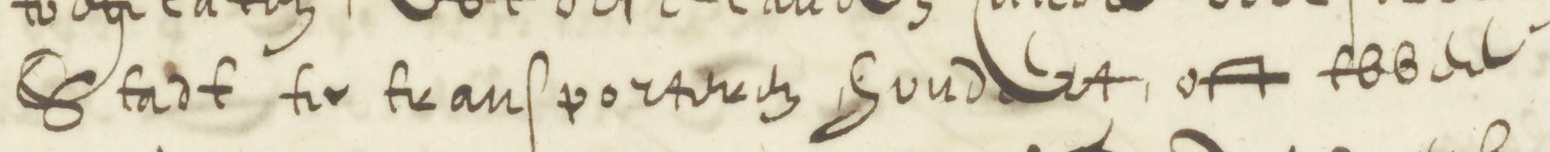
Stadt te transporteren hondert, oft twee
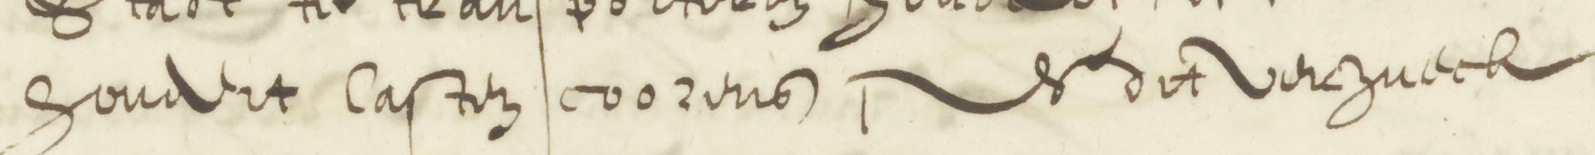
hondert lasten coorens Is verzueck
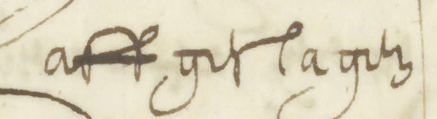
affgeslagen.
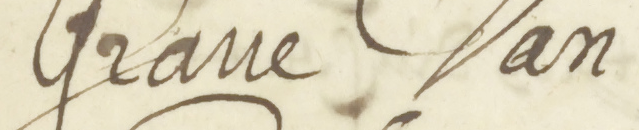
Graue Van
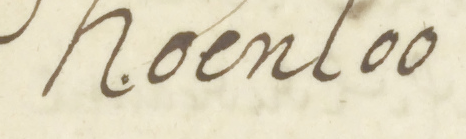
Hoenloo
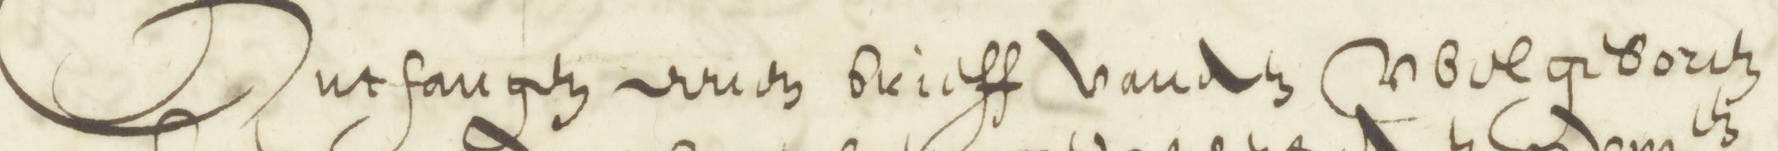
Ontfangen eenen brieff vanden welgeboren
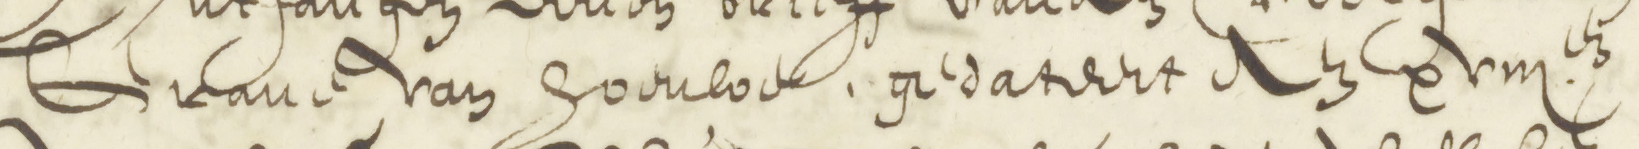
Graue van Hoenloo, gedateert den xviiien
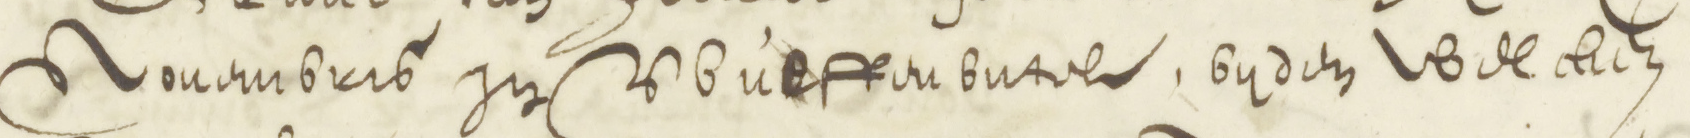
Nouembris In Wulffenbutel, byden welcken
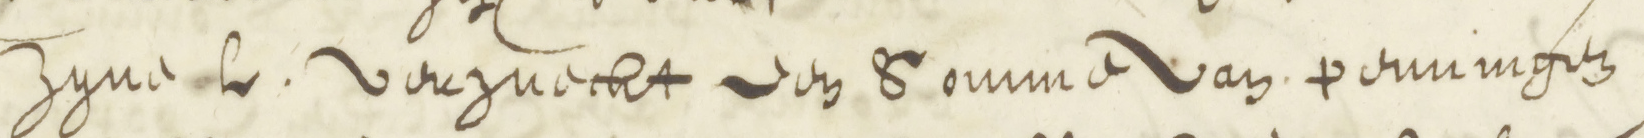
zyne L. verzueckt een Somme van penningen
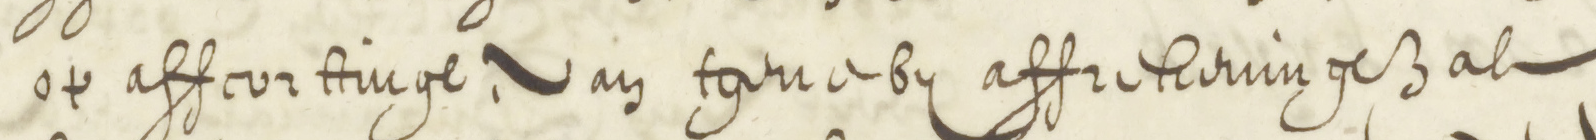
op affcortinge van tgene bij affrekeninge zal
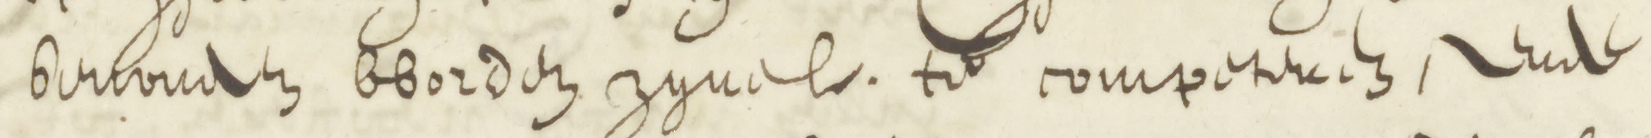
beuonden worden zyne L. te competeren, ende
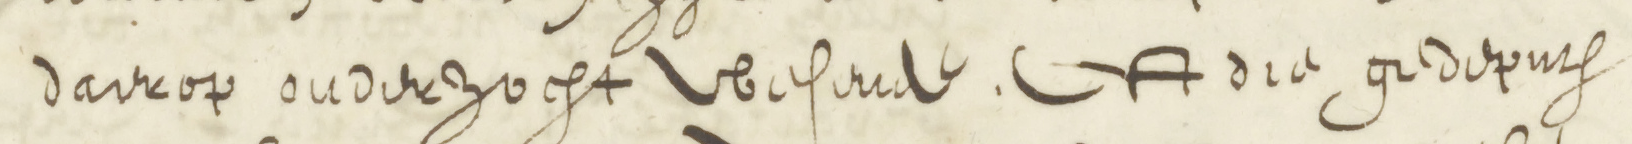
daerop onderzocht wesende, Off die gedeputs
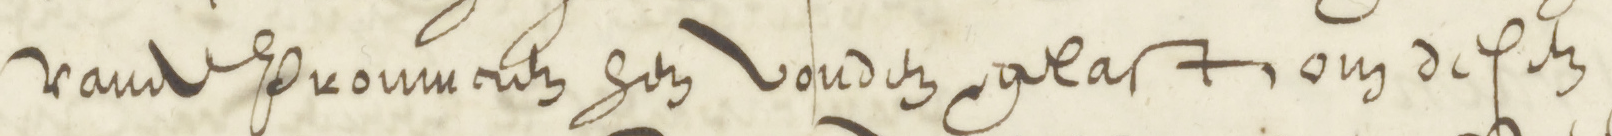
vande Prouincien hen vonden gelast, om desen
